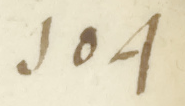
104
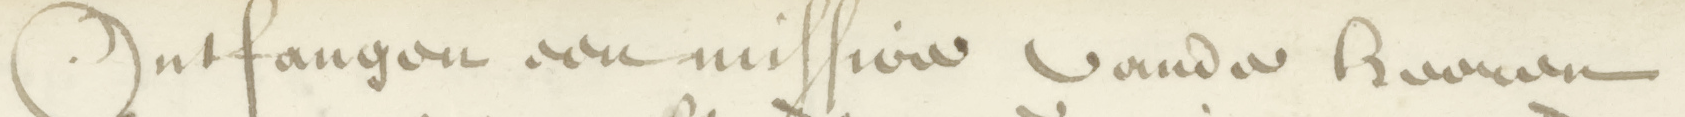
Ontfangen een missive vande heeren
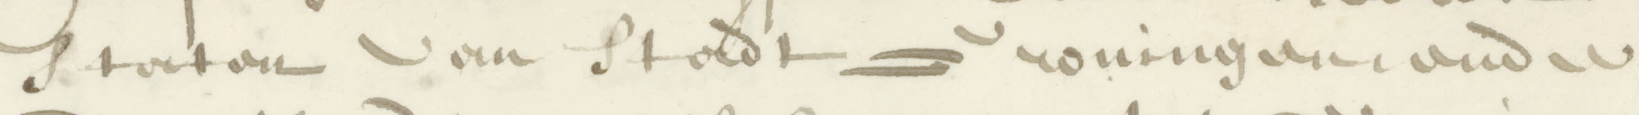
Staten van Stadt Groningen, ende
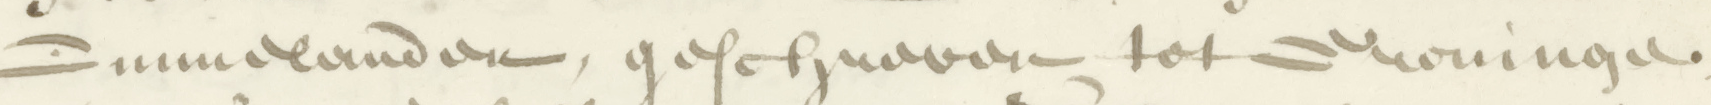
Ommelanden, geschreven tot Groninge
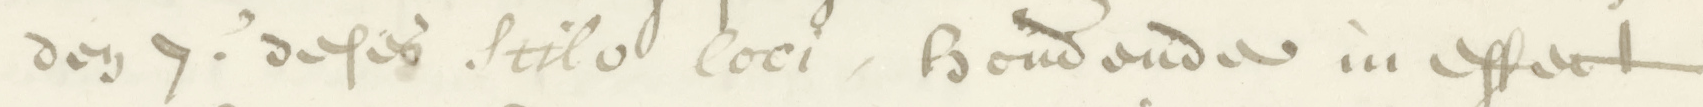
den 7e. deses, stilo loci, houdende in effect
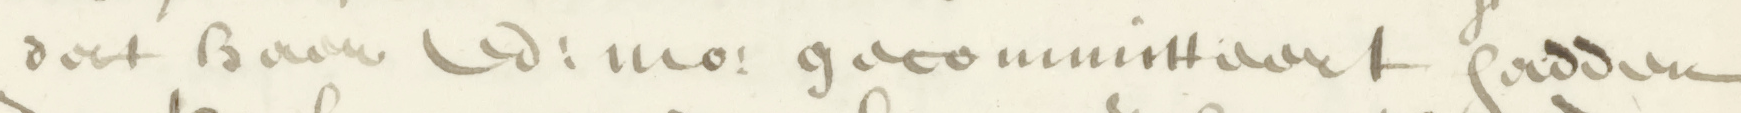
dat haer Ed:Mo: gecommitteert hadden
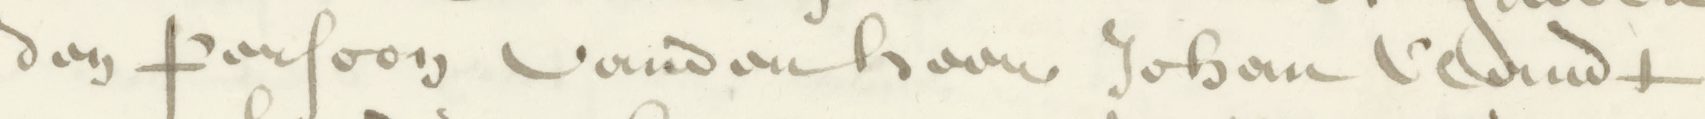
den Persoon vanden heer Johan Clandt
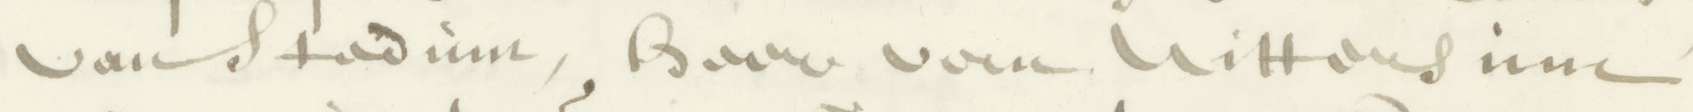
van Stedum, heer van Mittersum
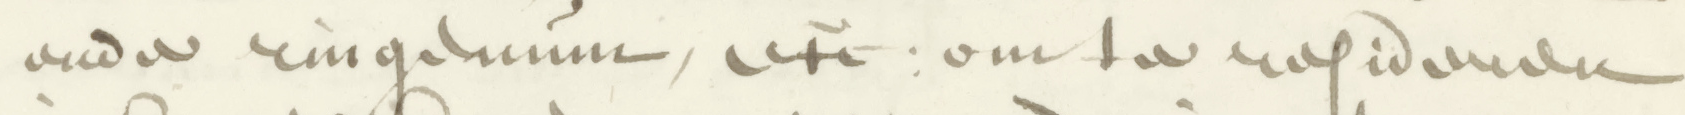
ende ringenum, etc: om te resideren
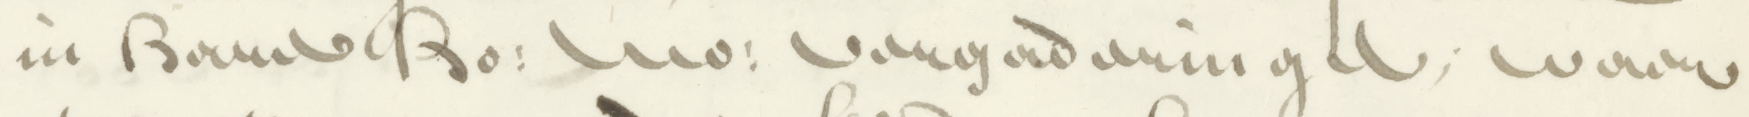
in haere Ho:Mo: Vergaderinge, waer
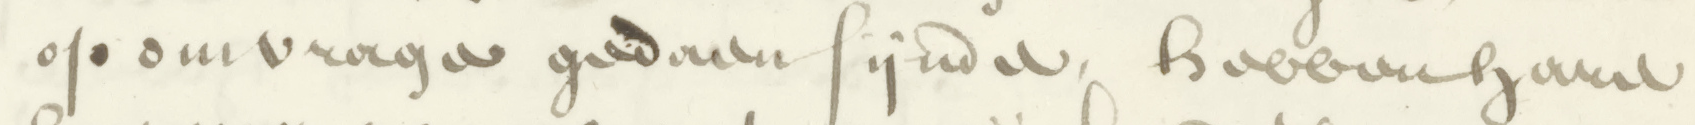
op omvrage gedaen sijnde, hebben hare
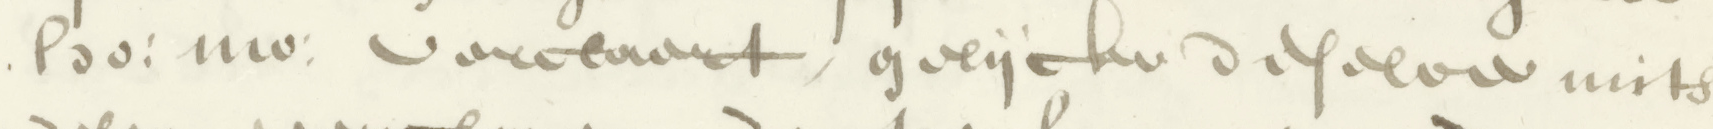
Ho:Mo: verclaert, gelijck deselve mits
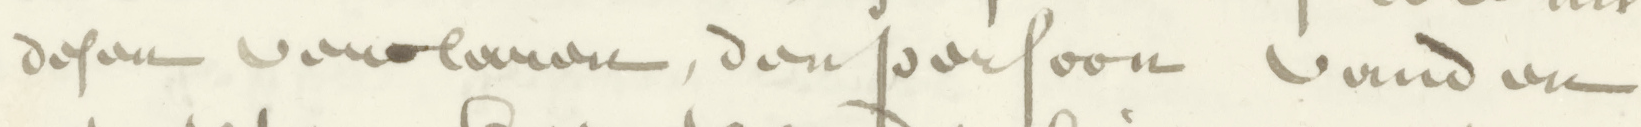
desen verclaren, den persoon vanden
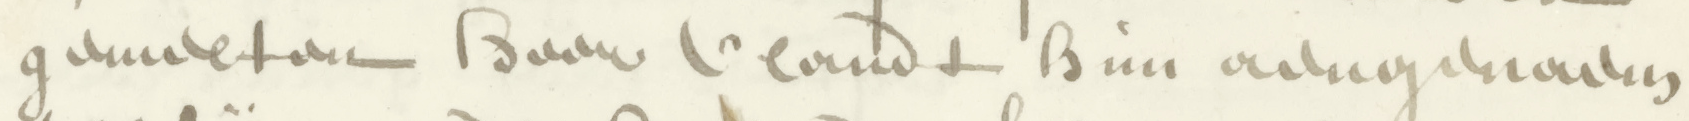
gemelten heer Clandt hun aengenaem
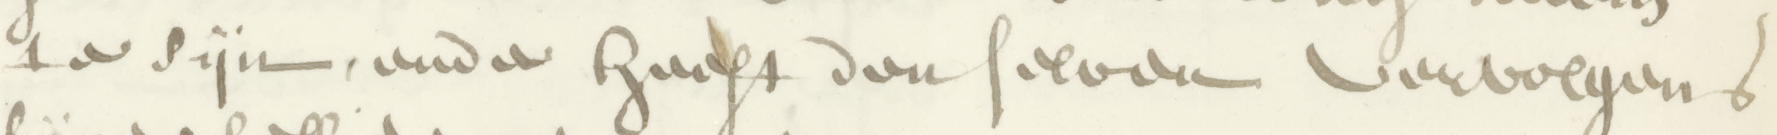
te sijn, ende heeft den selven vervolgens
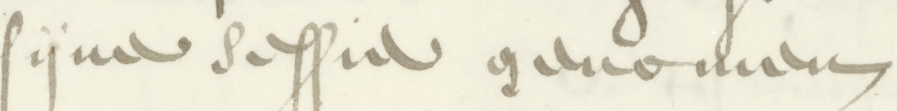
sijne sessie genomen.
